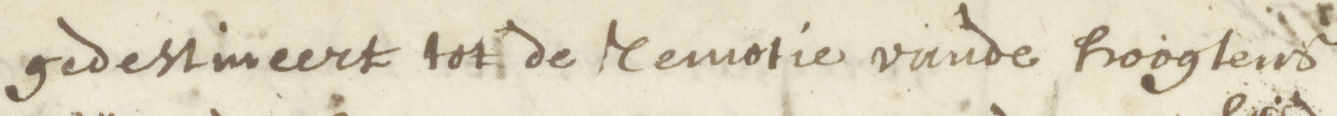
gedestineert tot de remotie vande hoogtens
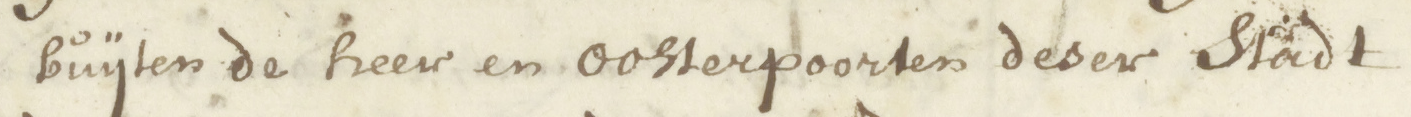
buijten de heeren Oosterpoorten deser Stadt
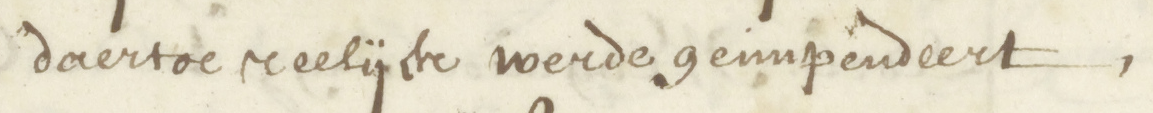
daertoe reelijck werde geimpendeert.
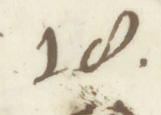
18.
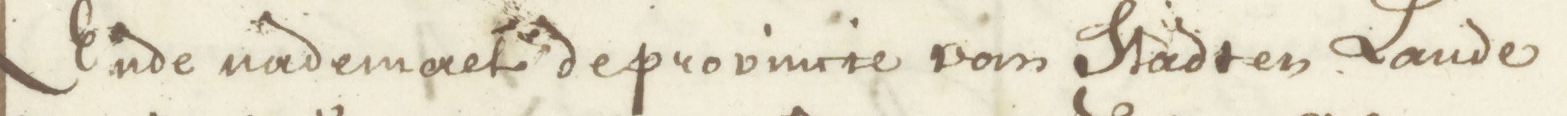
Ende nademael de provincie van Stadt en Lande
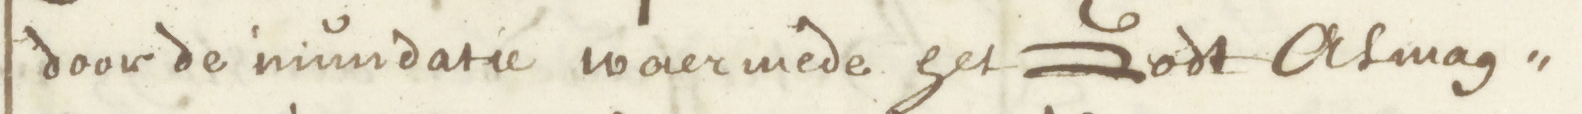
door de inundatie waermede het Godt Almag,,
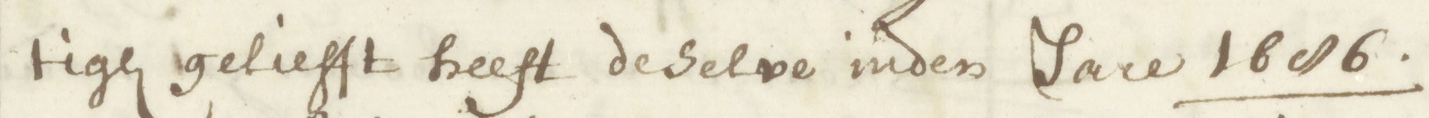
tigh geliefft heeft deselve inden Jare 1686.
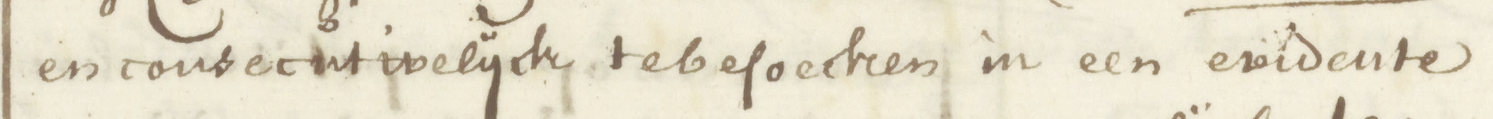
en consecutivelijck te besoecken in een evidente
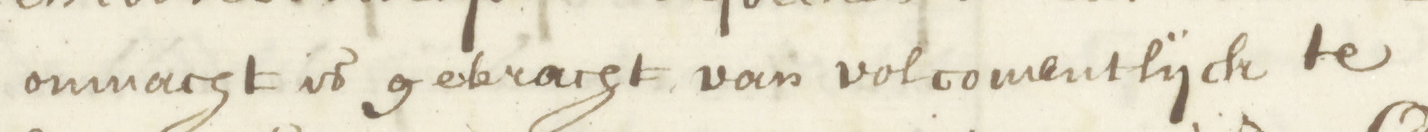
onmacht is gebracht van volcomentlijck te
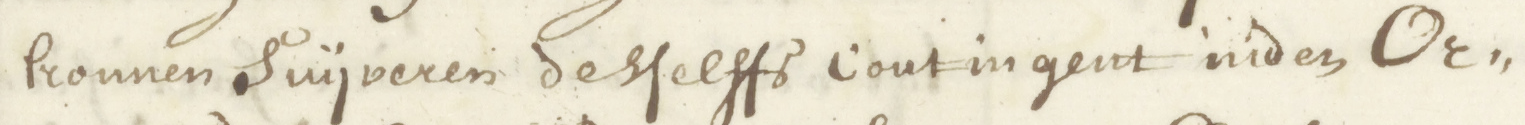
konnen Suijveren desselffs Contingent inden Or„
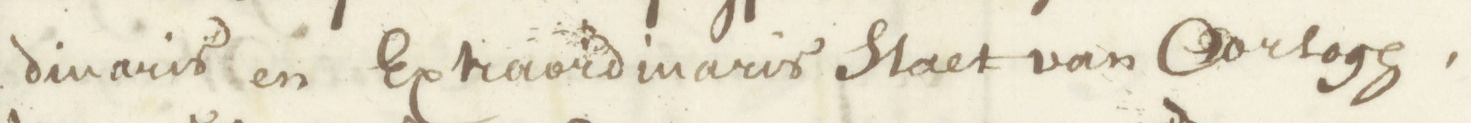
dinaris en Extiaordinaris Staet van Oorlogh,
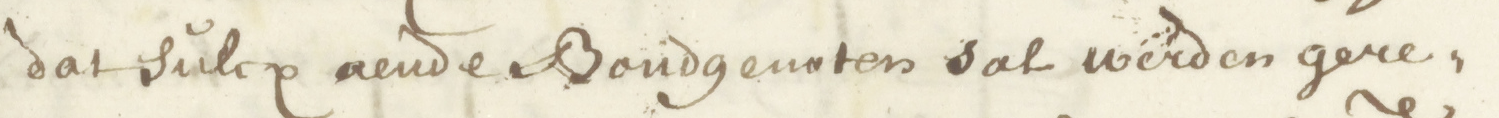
dat sulcx aende Bondgenoten sal werden gere„
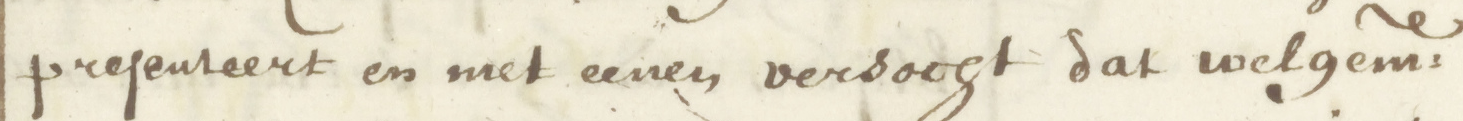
presenteert en met eenen versocht dat welgem:
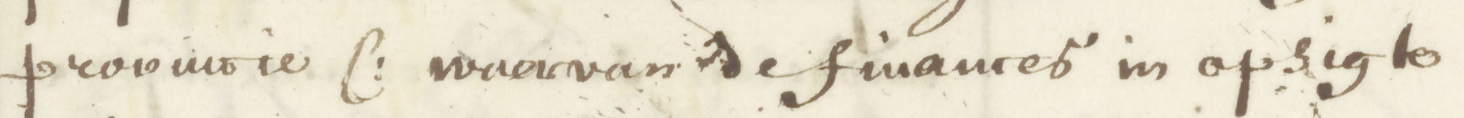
provincie (: waervan de finances in opsigte
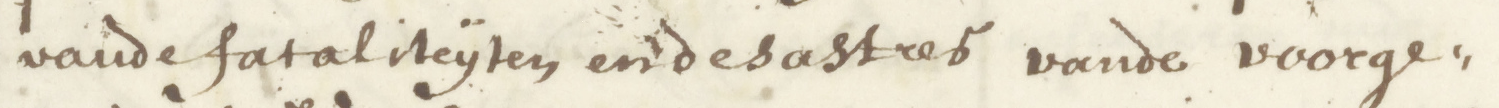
vande fataliteijten en desastres vande voorge„
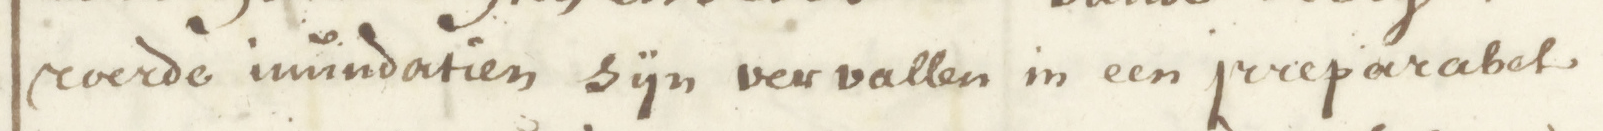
roerde inundatien sijn vervallen in een irreparabel
